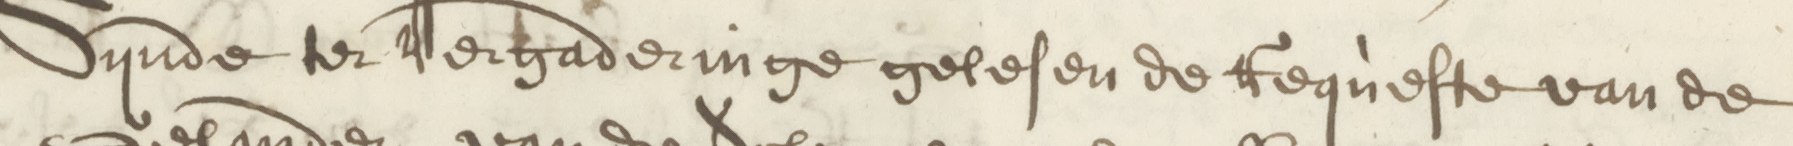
Synde ter Vergaderinge gelesen de Requeste van de
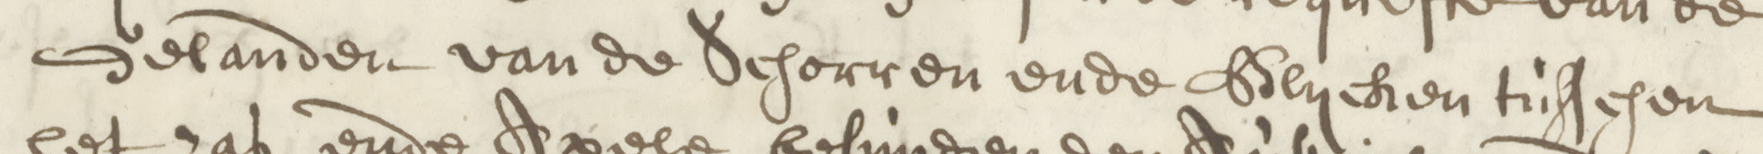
Gelanden van de Schorren ende Blycken tusschen
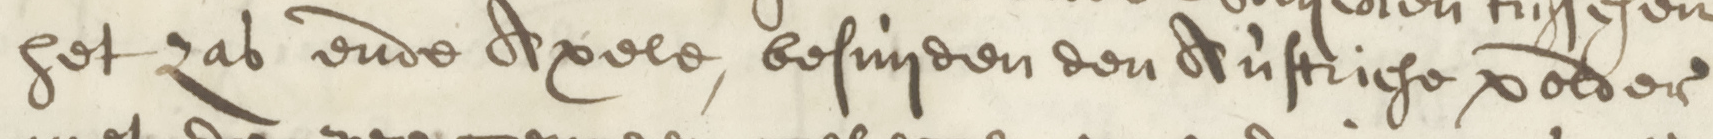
het zas ende Axele, besuyden den Austriche polder
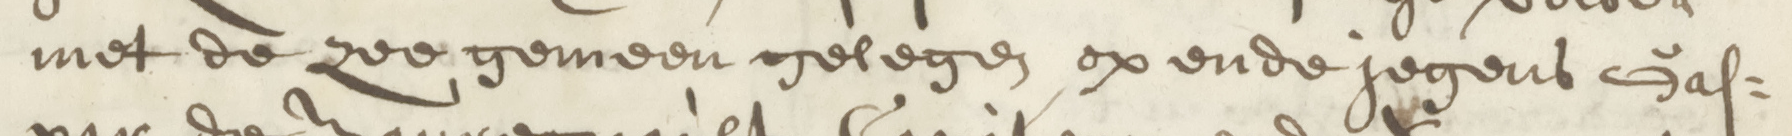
met de zee gemeen gelegen op ende jegens Gas=
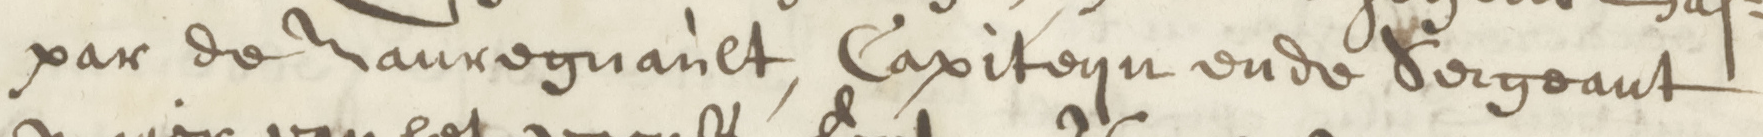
par de Mauregnault, Capiteyn ende Sergeant
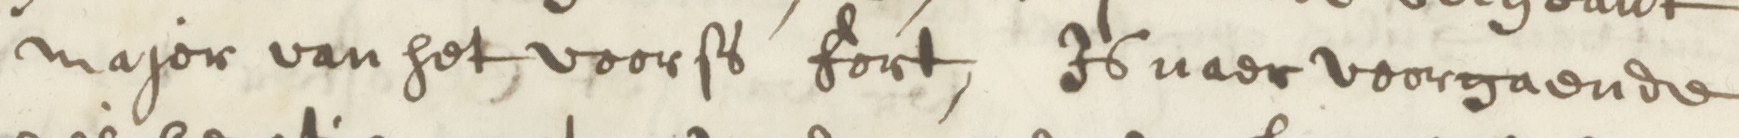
major van het voors fort, Is naer voorgaende
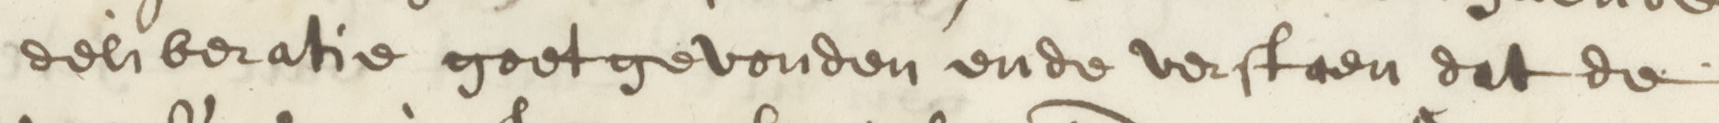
deliberatie goetgevonden ende verstaen dat de
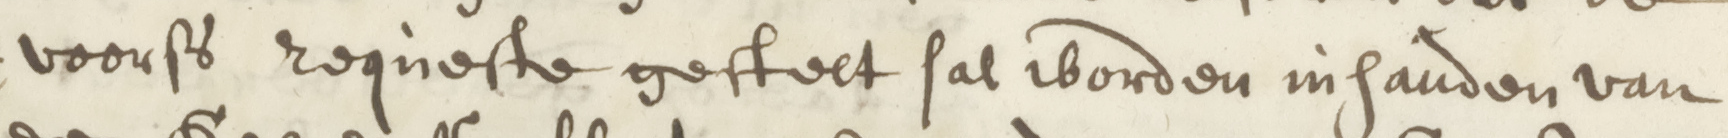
voors requeste gestelt sal worden in handen van
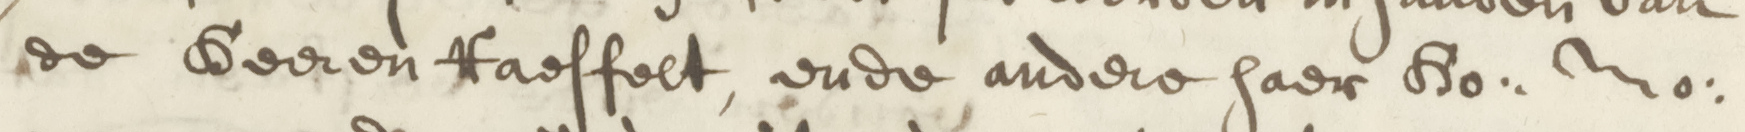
de Heeren Raesfelt, ende andere haer Ho:Mo:
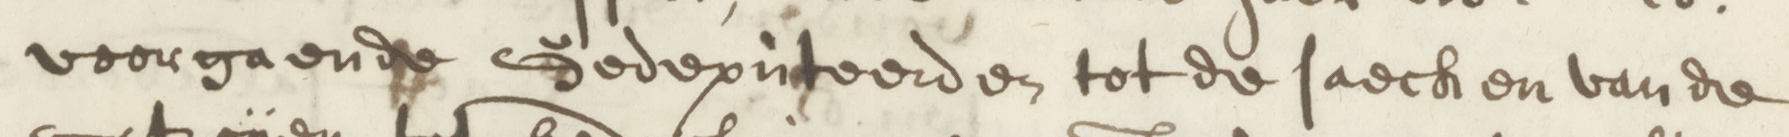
voorgaende Gedeputeerden tot de saecken van de
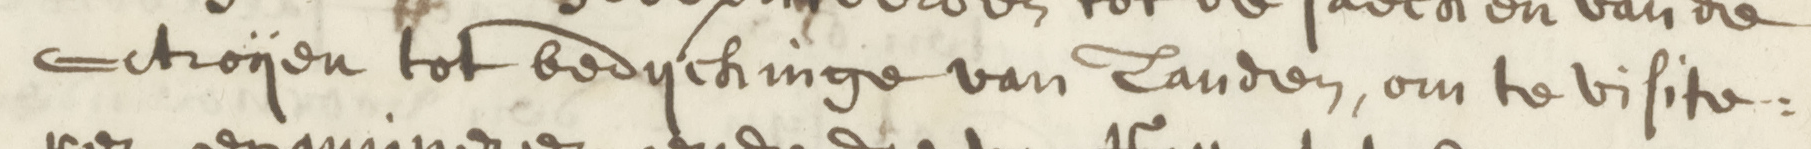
Otroijen tot bedyckinge van Landen, om te visite=
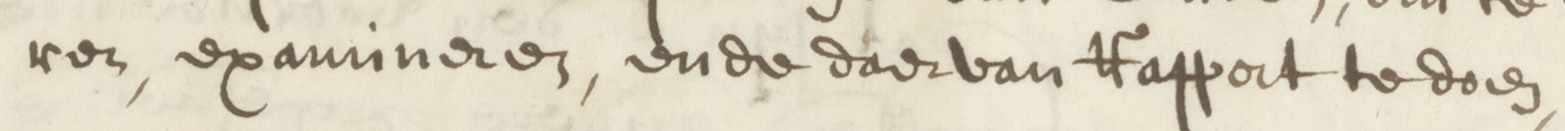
ten, examineren, ende daervan Rapport te doen.
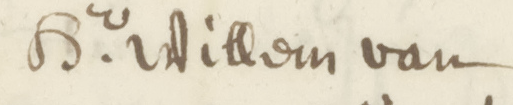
Hr. Willem van
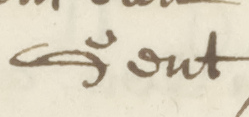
Gent
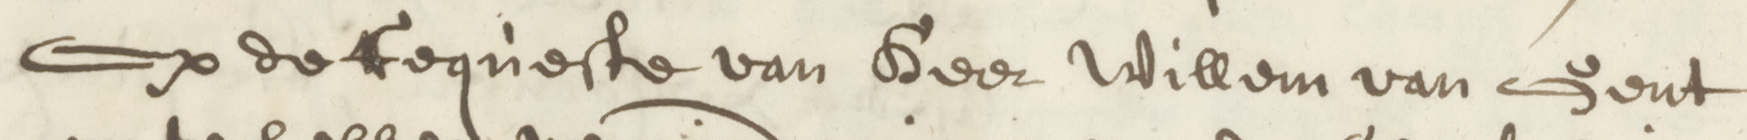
Op de Requeste van Heer Willem van Gent
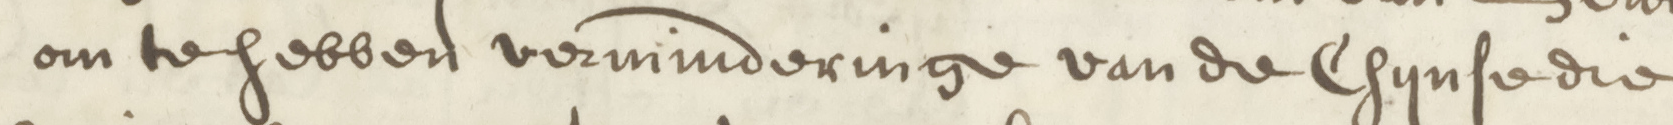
om te hebben verminderinge van de Chynse die
